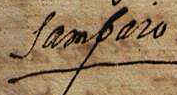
sampaio
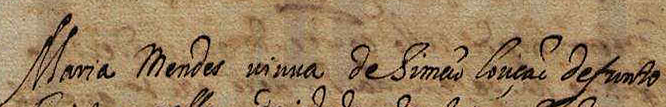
Maria Mendes uiuua de Simaõ louçaõ defunto
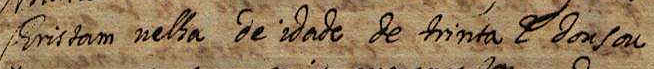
Christam uelha de idade de trinta E dous ou
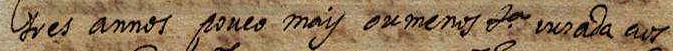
tres annos pouco mais ou menos t.a iurada aos
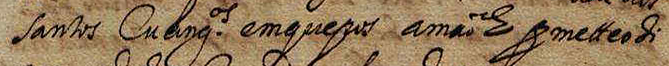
santos Euang.os em que pos a maõ E ꝓmetteo di
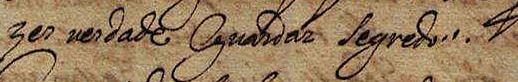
zer uerdade E guardar segredo.
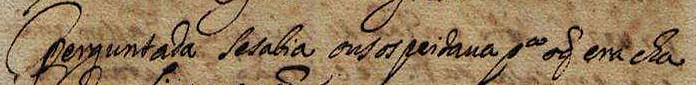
perguntada se sabia ou sospeitaua pa o q̄ era cha
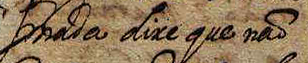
mada dixe que naõ.
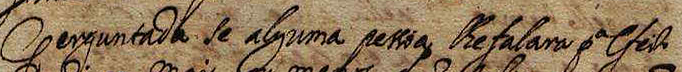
E perguntada se alguma pessoa lhe falara pa efeito
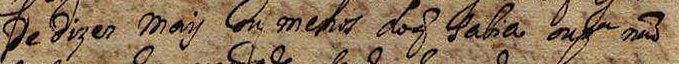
de dizer mais ou menos ao q̄ sabia ou pa naõ
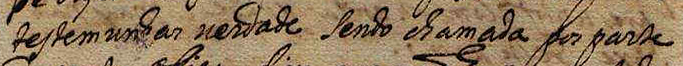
testemunhar uerdade sendo chamada por parte
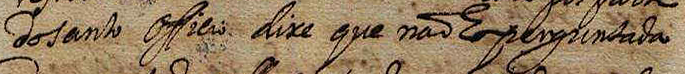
do santo Officio dixe que naõ he perguntada
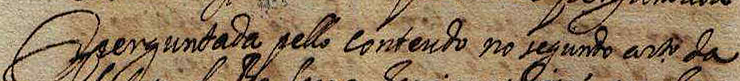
E perguntada pello conteudo no segundo arto da
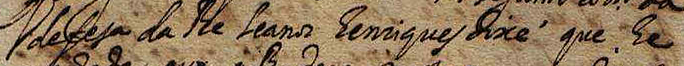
defesa da Re leanor henriques dixe que he
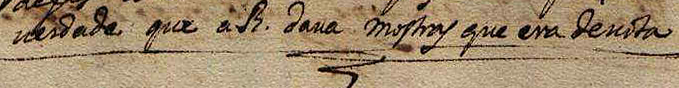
uerdade que a R. daua mostras que era deuota
